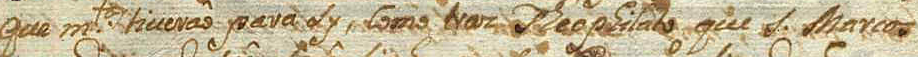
que m.tos tiueraõ para sy, como traz Theophilato que s. Marcos
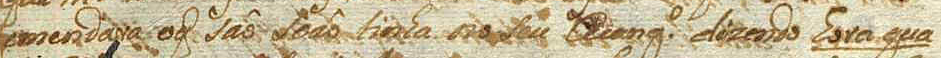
emendara o q̄ saõ Ioaõ tinha no seu Euang.o dizendo hora qua
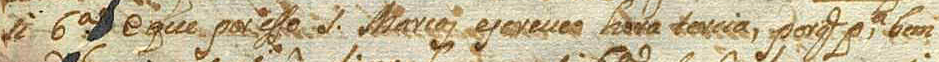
si 6a. que por esso s. Marcos escreueo hora tercia, porq̄ p.a bem
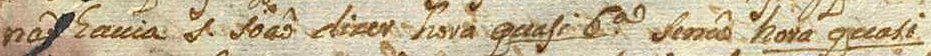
naõ hauia s. Ioaõ dizer hora quasi 6.as senão hora quasi
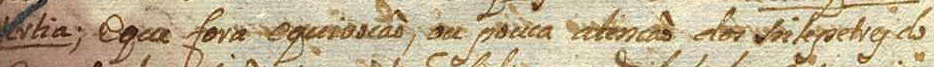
_rtia; e que fora equiuocaõ, ou pouca atençaõ dos Intepetres do
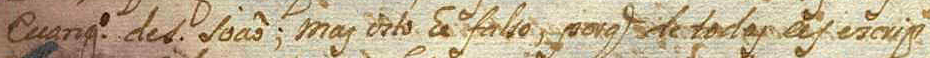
Euang.o de s. Ioaõ; mas isto he falso, porq̄ de todas as escrip
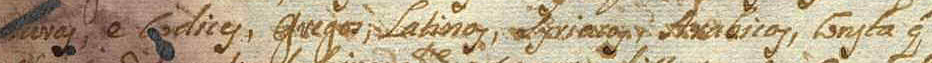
uras, e Codices, Gregos, Latinos, syriacos, Arabicos, Consta q̄
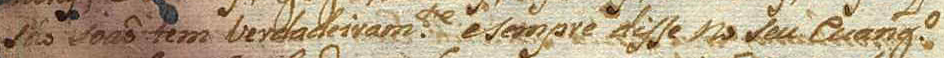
são Ioaõ tem verdadeiram.te e sempre disse no seu Euang.o
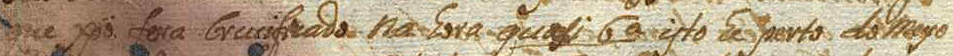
que xpō fora Crucificado na hora quasi 6a isto he perto do meyo
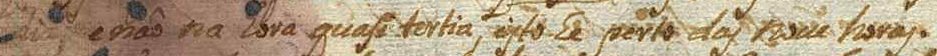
dia, e naõ na hora quasi tertia isto he perto das noue horas.
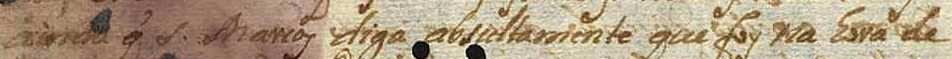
q̄ s. Marcos diga absultamente que foy na hora de
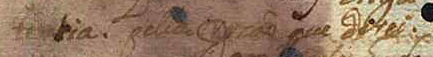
tertia pela razaõ que direi.
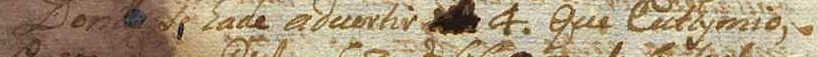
Don__ se ha de aduertir _ 4. Que Euthymio,
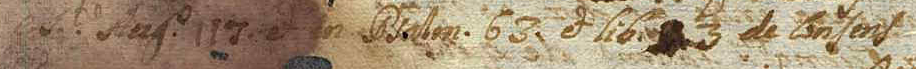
e s.to Aug.o 117. et in Psalm. 63 et lib_ 3 de Consens
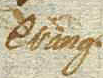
Evang
